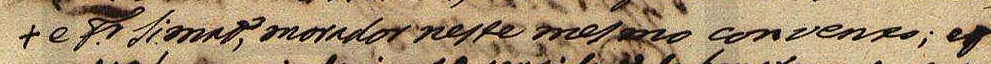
+ e F.r Simaõ, morador neste mesmo convento; e q̄
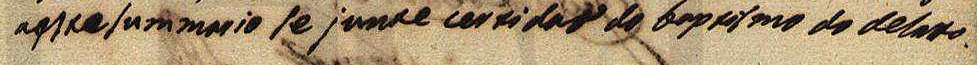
a este summario se junte certidaõ do baptismo do delato
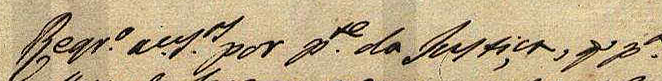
Reqr.o a vs.as por p.te da Iustiça, q̄ p.a
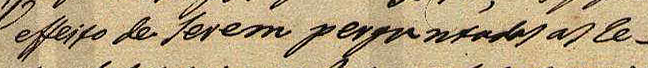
effeito de serem perguntadas as Re
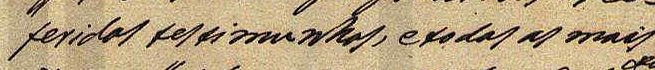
feridas testimunhas, e todas as mais
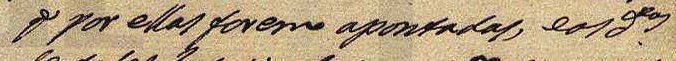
q̄ por ellas forem apontadas, e os d.os
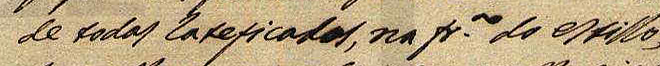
de todos Rateficados, na fr.a do estillo
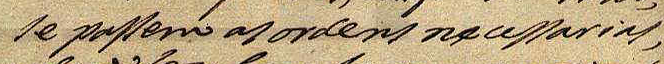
se passem as ordens necessarias,
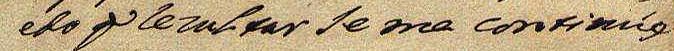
e do q̄ Rezultar se ma continue
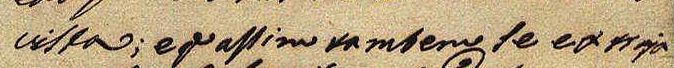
vista; e q̄ assim tambem se extraya
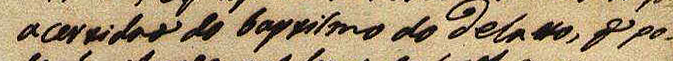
a certidaõ do baptismo do delatto, q̄ po
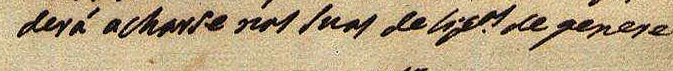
derá acharse nas suas delig.as de genere.
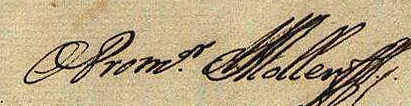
O Prom.or Moller
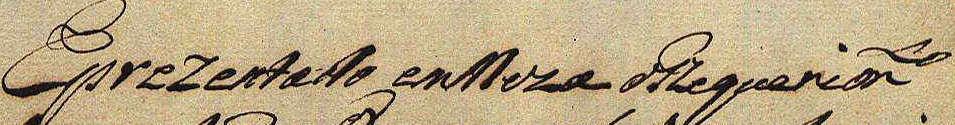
E prezentado em Meza o Requeremto
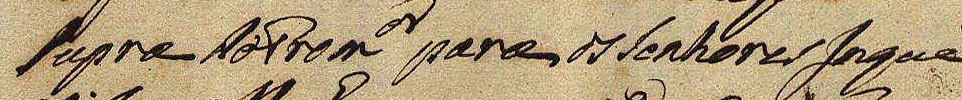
supra do Promor para os senhores Jnqui
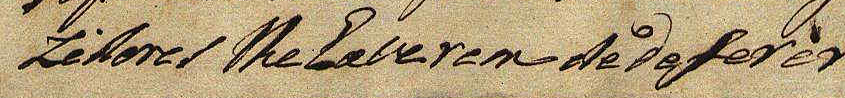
zidores lhe haverem de deferer
